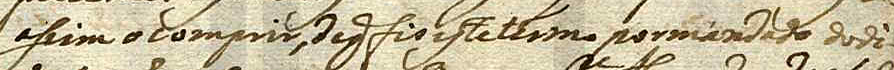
assim o comprir, de q̄ fis este termo por mandado do di
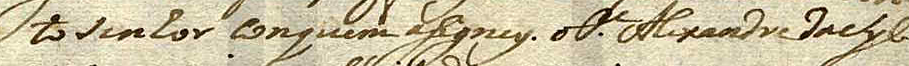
to senhor con quem asigney. o P.e Alexandre da Syl
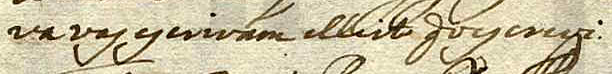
va vas escrivam elleito q̄ o escrevi.
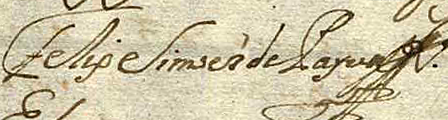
Felix Simoẽs de Payva
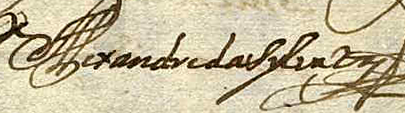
Alexandre da Sylva Vas
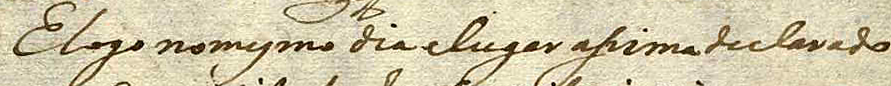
E logo no mesmo dia e lugar assima declarado
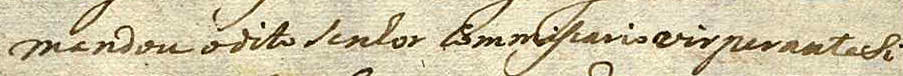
mandou o dito senhor Commissario vir perante Si
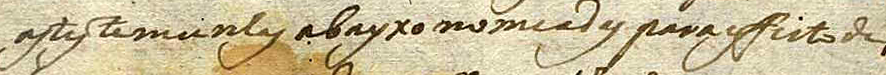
as testemunhas abayxo nomeadas para effeito de
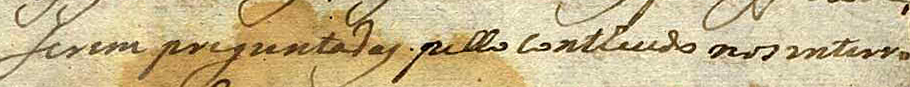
serem preguntadas pello contheudo nos interro
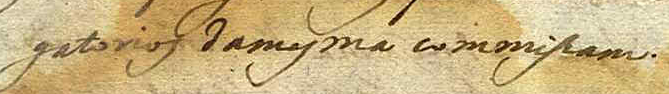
gatorios da mesma commissam.
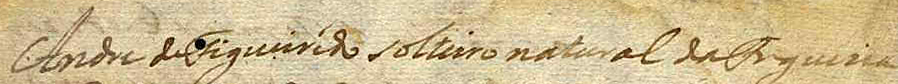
Andre de Figueiredo solteiro natural da Freguezia
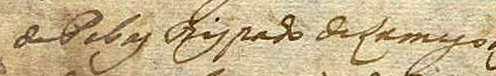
de Pebas Bispado de Lamego
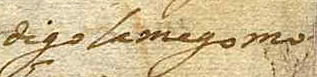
digo Lamego mo
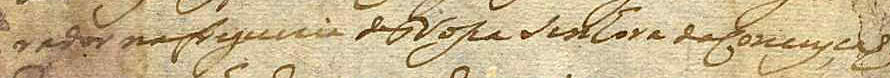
rador na freguezia de Nossa Senhora da Conceyçaõ
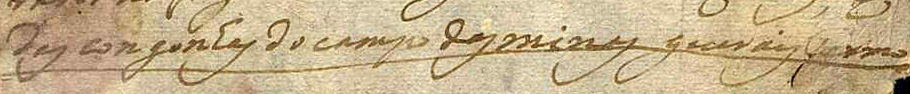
das congonhas do campo das minas guerais Termo
